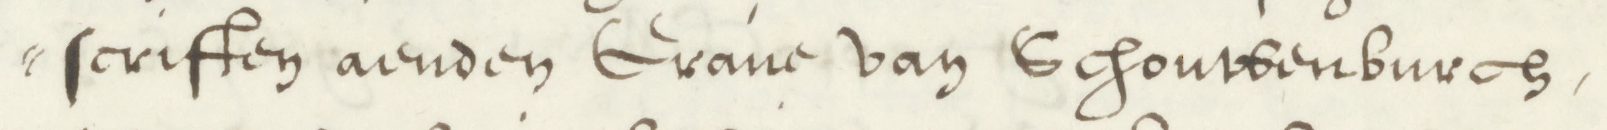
„scriften aenden Graue van Schouwenburch,
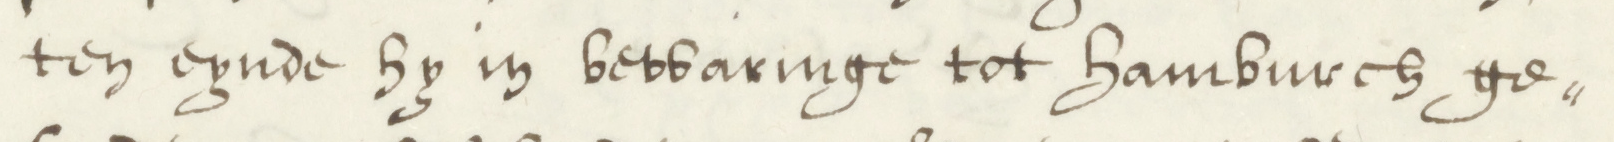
ten eynde hy in bewaringe tot hamburch ge„
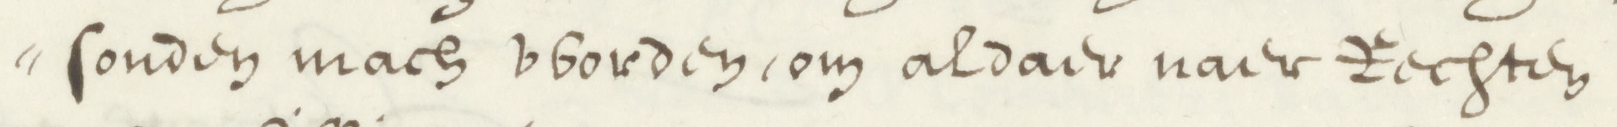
„sonden mach worden, om aldaer naer Rechten
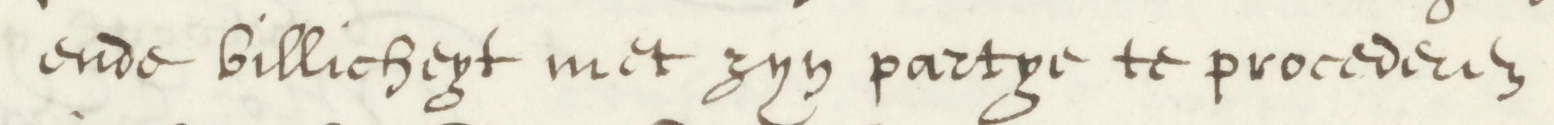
ende billicheyt met zyn partye te procederen
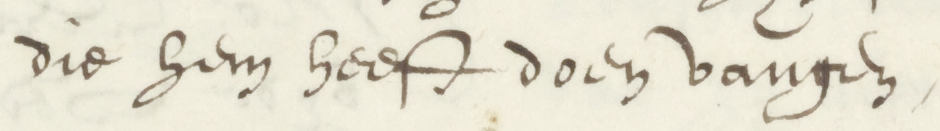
die hem heeft doen vangen.
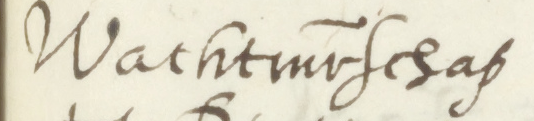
Wachtmrschap
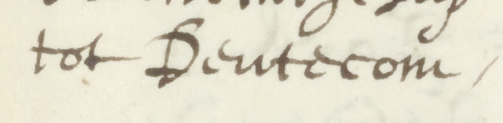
tot Deutecom.
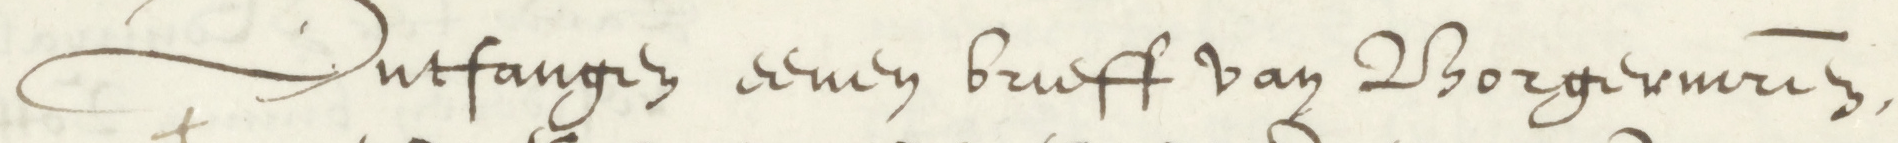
Ontfangen eenen brieff van Borgermren,
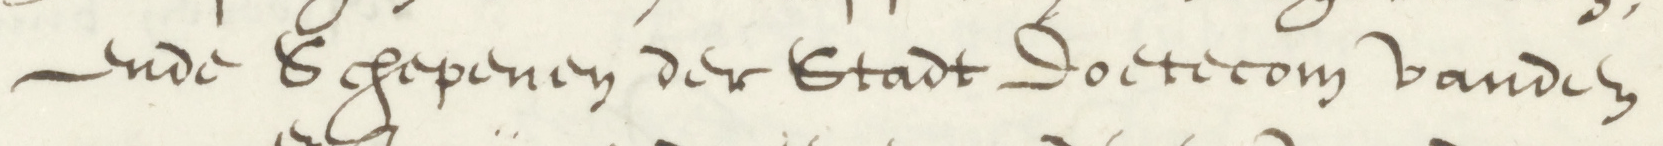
ende Schepenen der Stadt Doetecom vanden
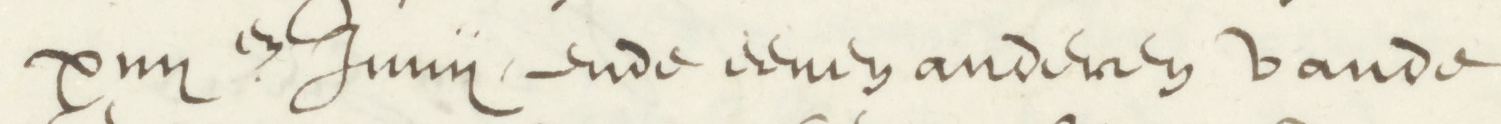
xiiijen Junij, ende eenen anderen vande
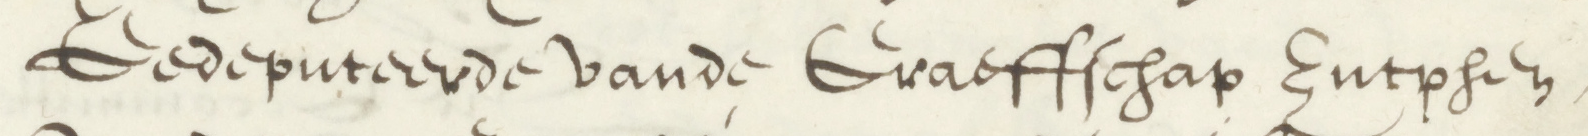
Gedeputeerde vande Graeffschap Zutphen,
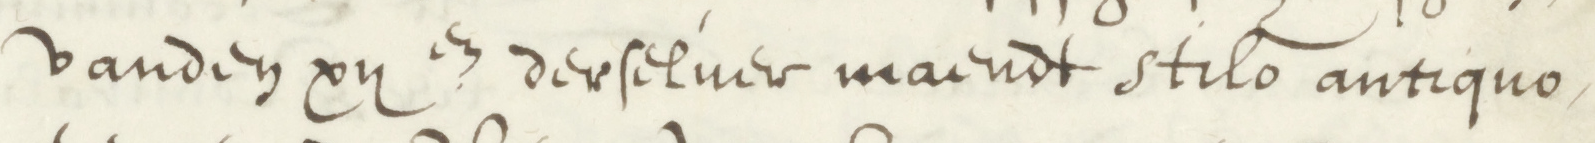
vanden xijen derselver maendt stilo antiquo,
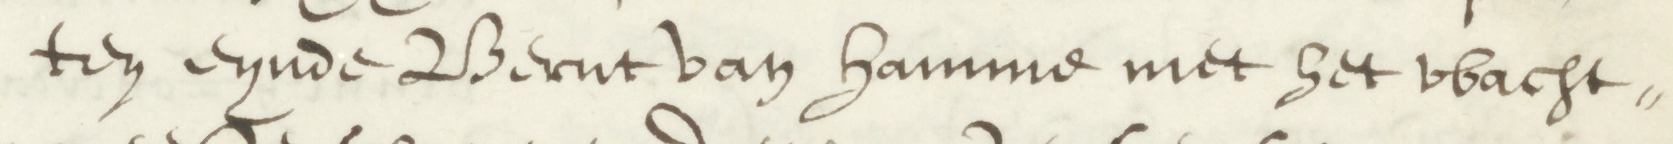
ten eynde Bernt van Hamme met het wacht„
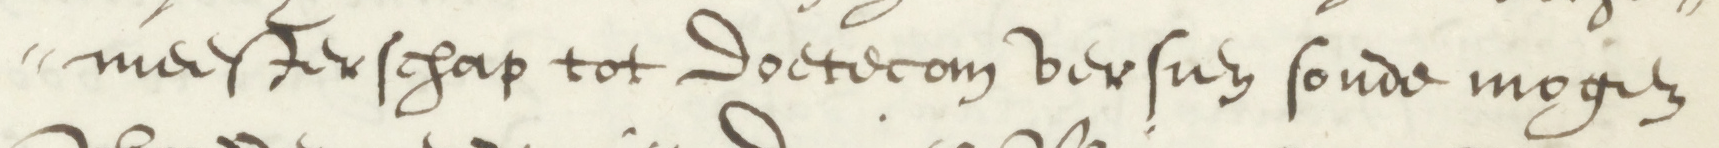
„meesterschap tot Doetecom versien soude mogen
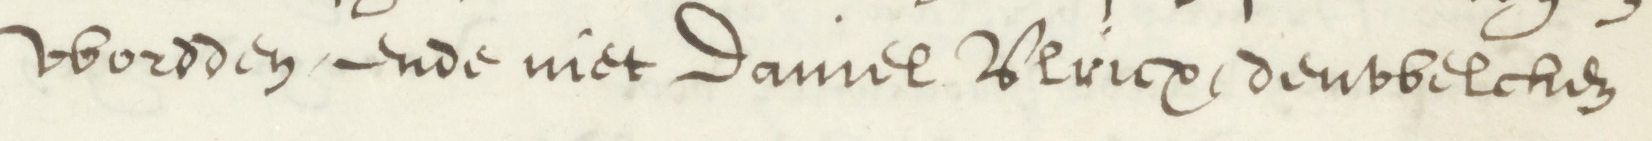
wordden, ende niet Daniel Ulricx, denwelcken
